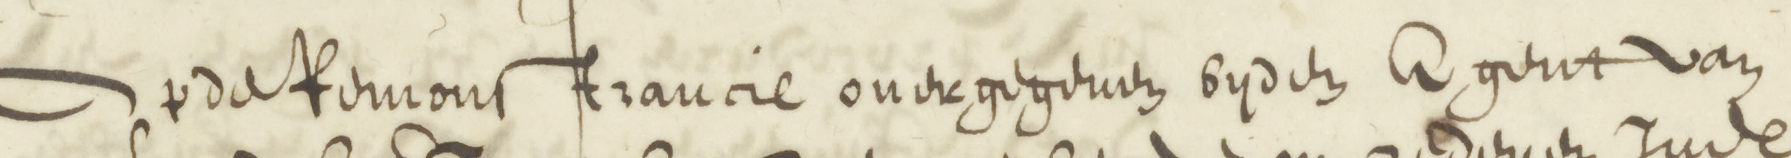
Op de Remonstrancie overgegeuen byden Agent van
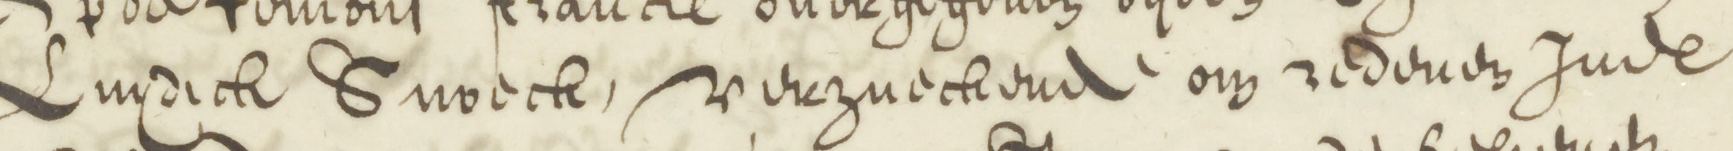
Luydick Snoeck, verzueckende om redenen Inde
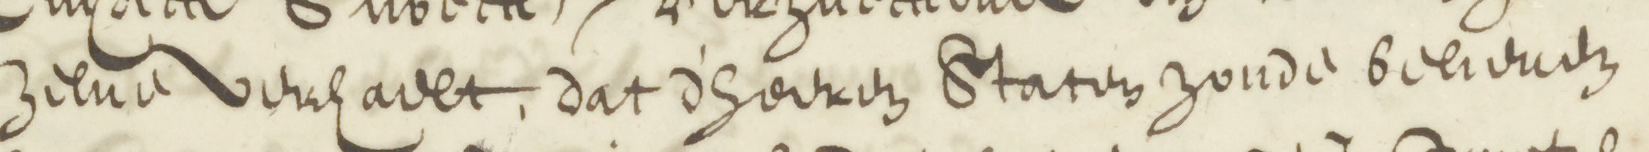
zelue verhaelt, dat d‛heeren Staten zoude belieuen
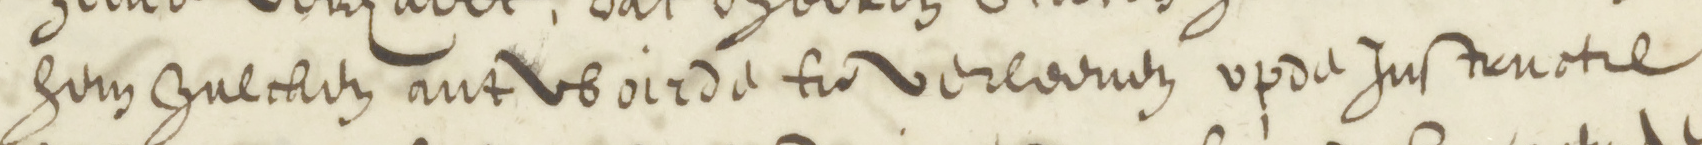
hem zulcken antwoirde te verleenen opde Instructie
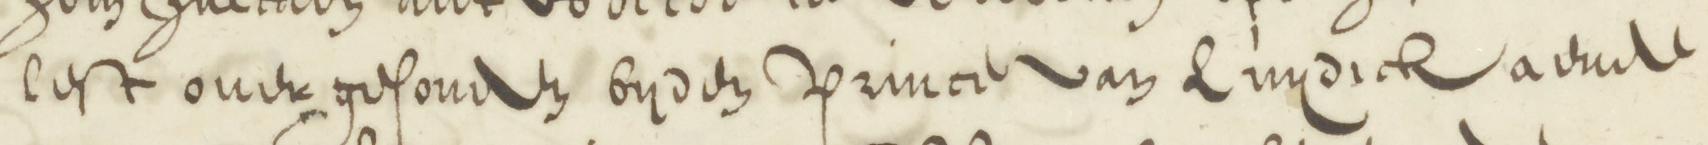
lest overgesonden byden prince van Luydick aende
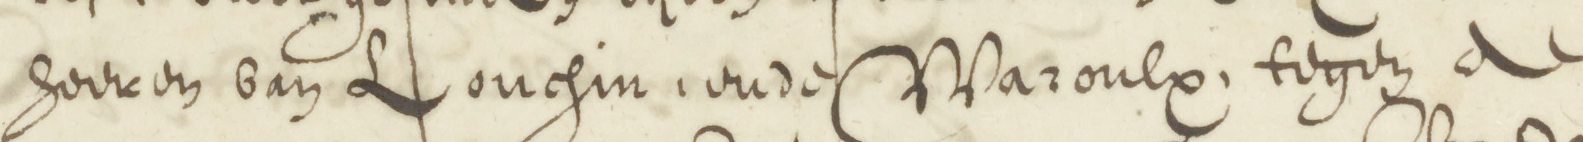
heeren van Lonchin ende Waroulx, tegen de
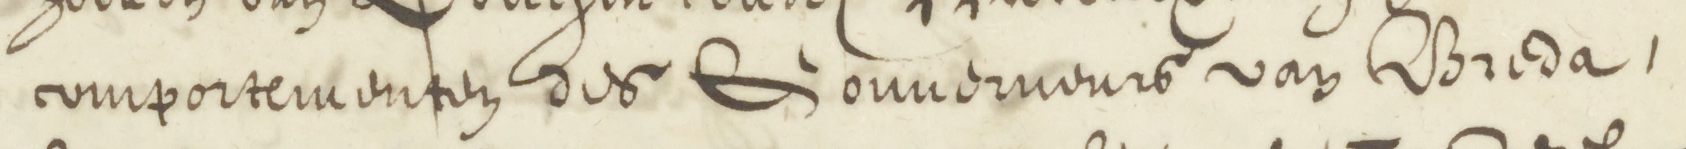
comportementen des Gouuerneurs van Breda,
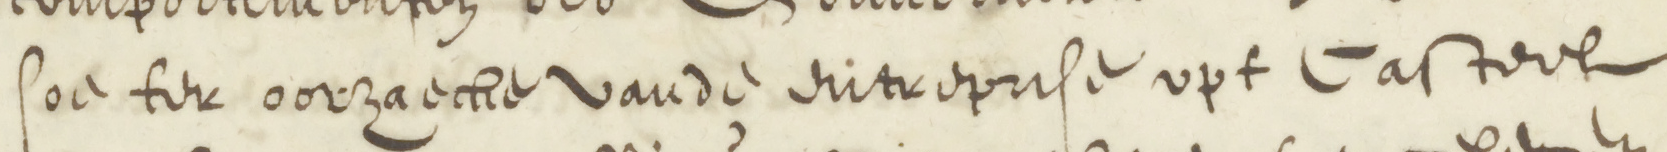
soe ter oorzaecke vande entreprise opt Casteel
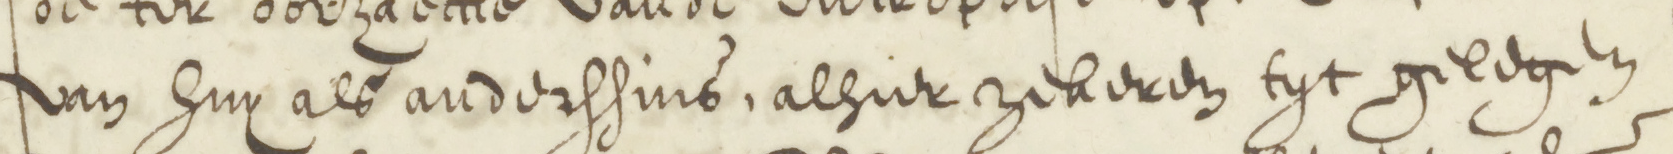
van huy als anderssins, alhier zekeren tyt gelegen
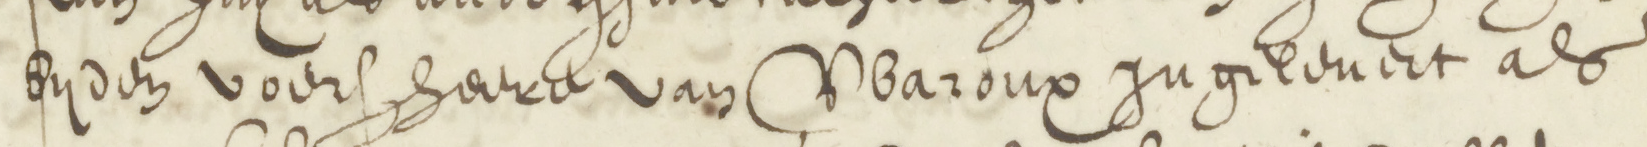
byden voers heere van Waroux ingeleuert als
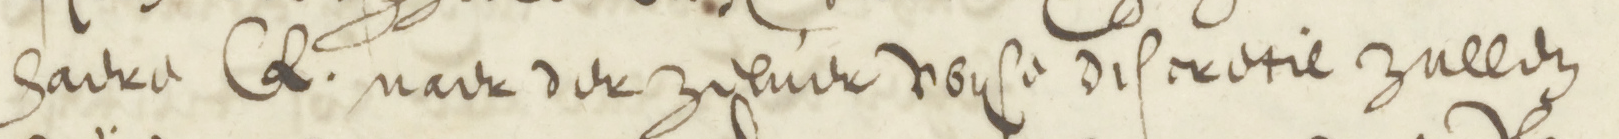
haere E. naer der zeluer wyse discretie zullen
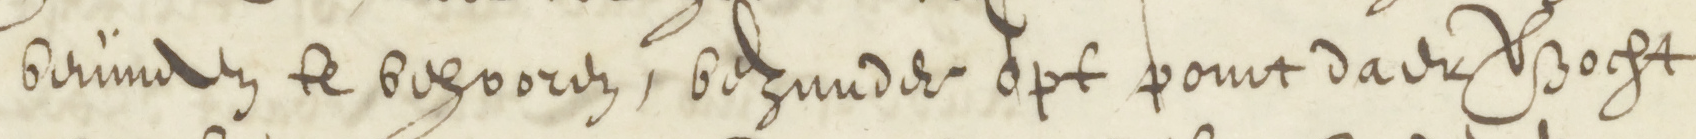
beuinden te behooren, bezunder opt point daer vzocht
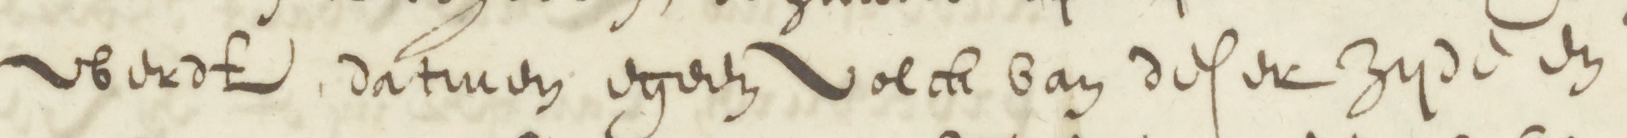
werdt, datmen egeen volck van deser zyde en
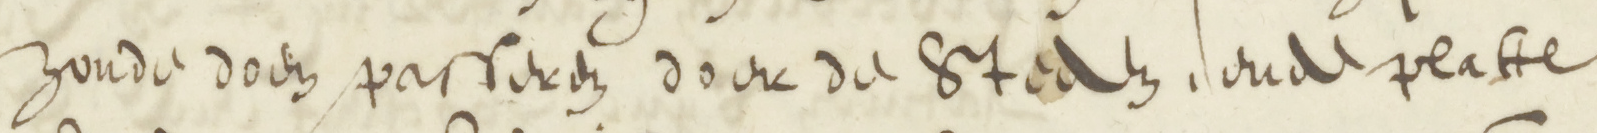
zoude doen passeren doer de Steden, ende platte
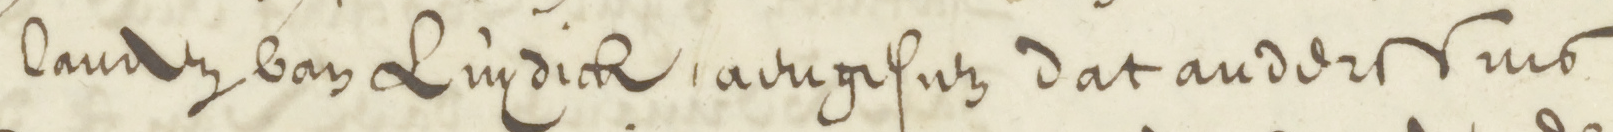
landen van Luydick, aengesien dat anderssins
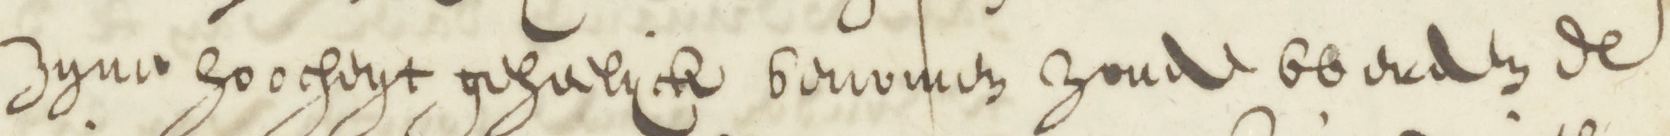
zyne hoocheyt geheelijck benomen zoude werden de
